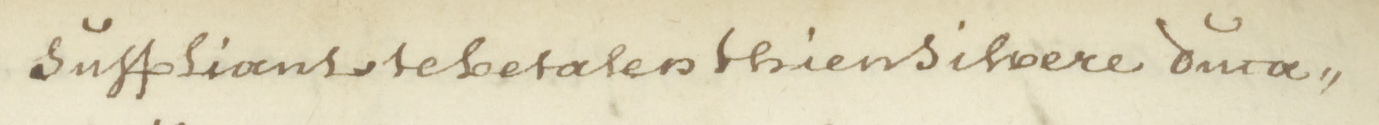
suppliant te betalen thien silvere duca„
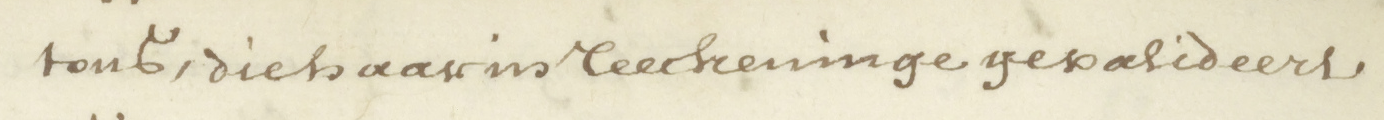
tens, die haar in reeckeninge gevalideert
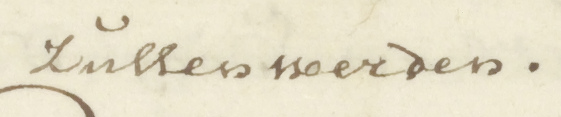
zullen werden.
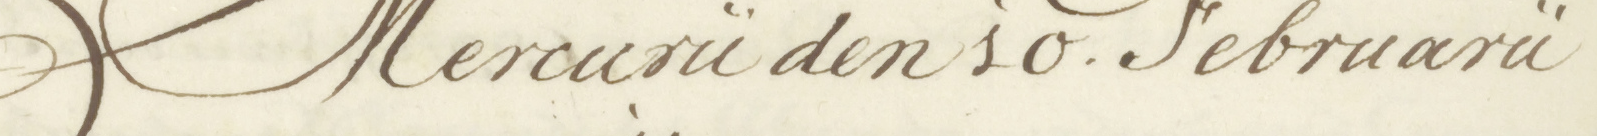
Mercurie den 10. Februarii
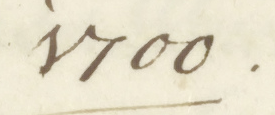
1700.
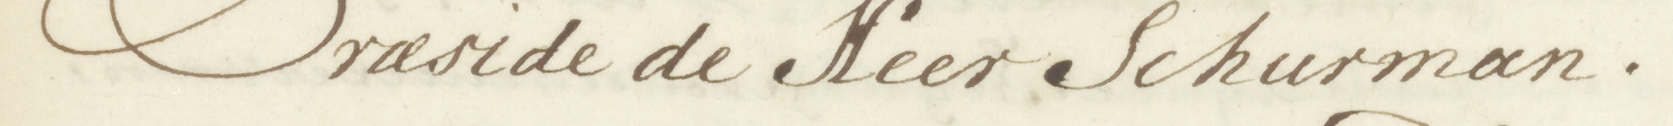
Præside de Heer Schurman.
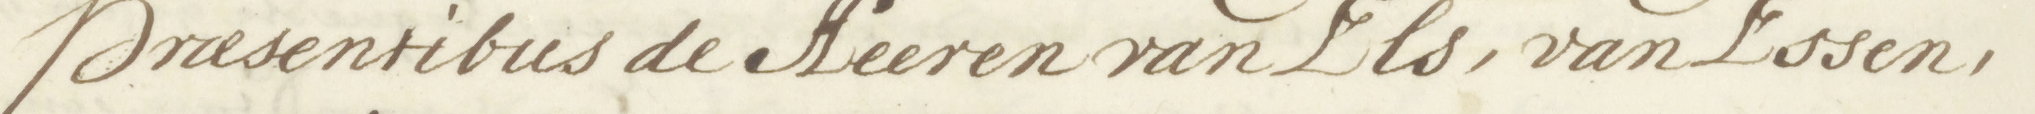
Præsentibus de Heeren van Els, van Essen,
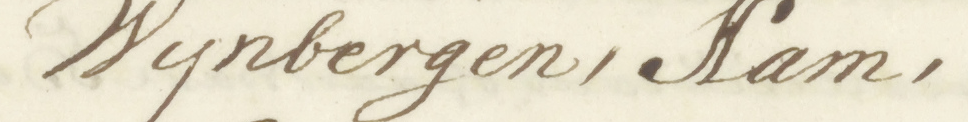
Wynbergen, Ham.
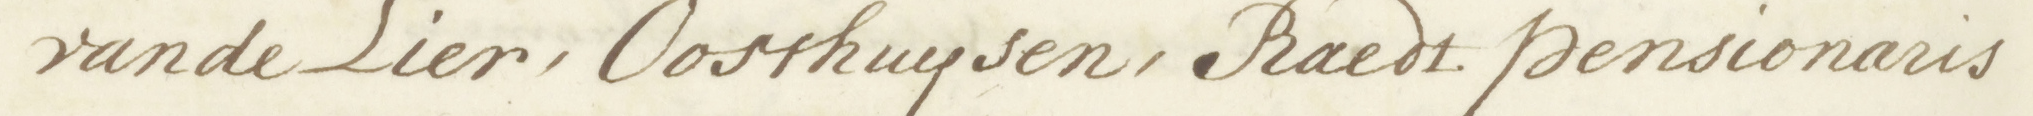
vande Lier, Oosthuiysen, Raedt pensionaris
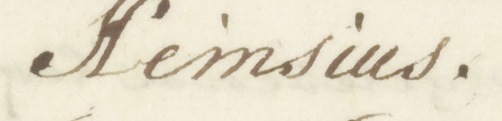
Heinsius.
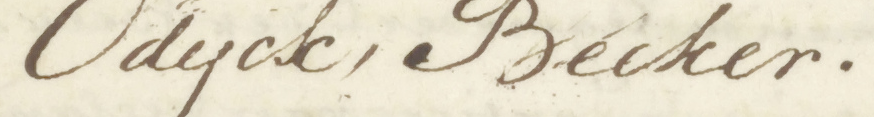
Odyck, Becker.
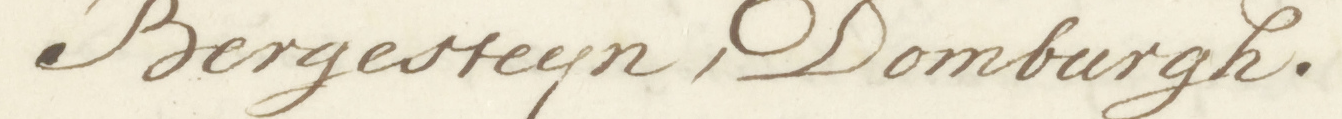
Bergesteyn, Domburgh.
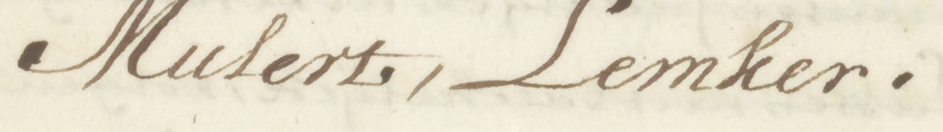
Mulert, Lemker.
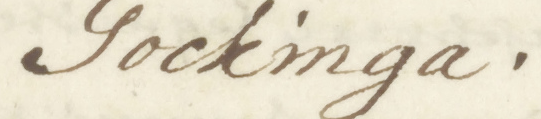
Gockinga.
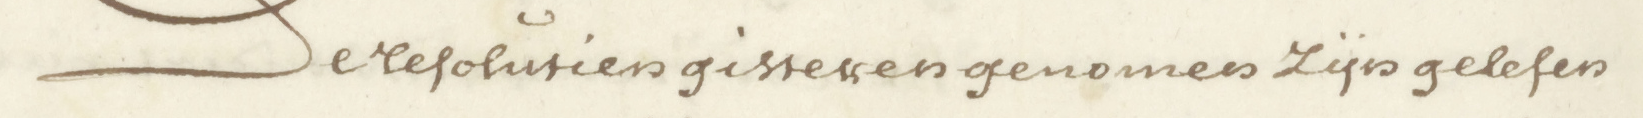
De resolutien gisteren genomen zijn gelesen
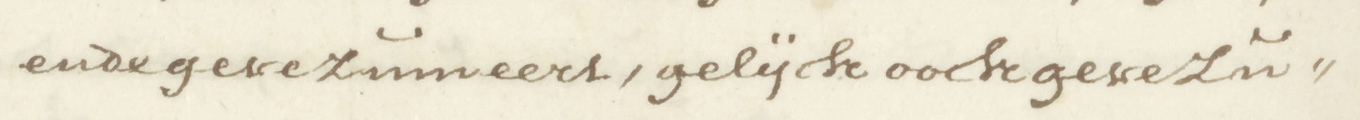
ende gerezumeert, gelijck oock gerezu„
